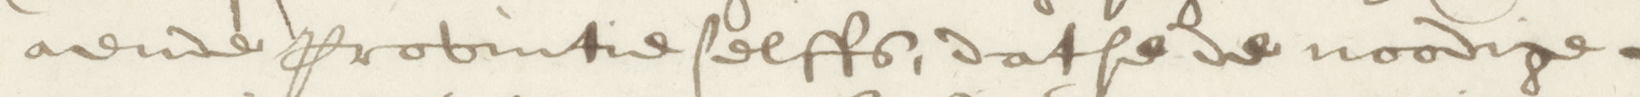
aende Provintie selffs datse de noodige
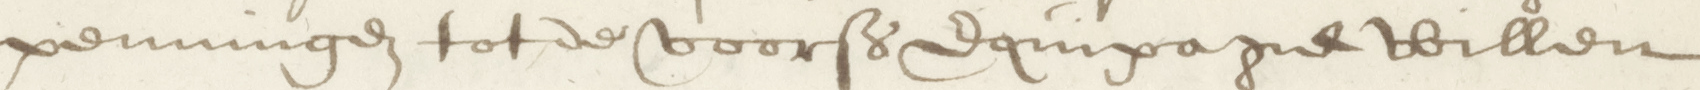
penningen tot de voors Equipagie willen
